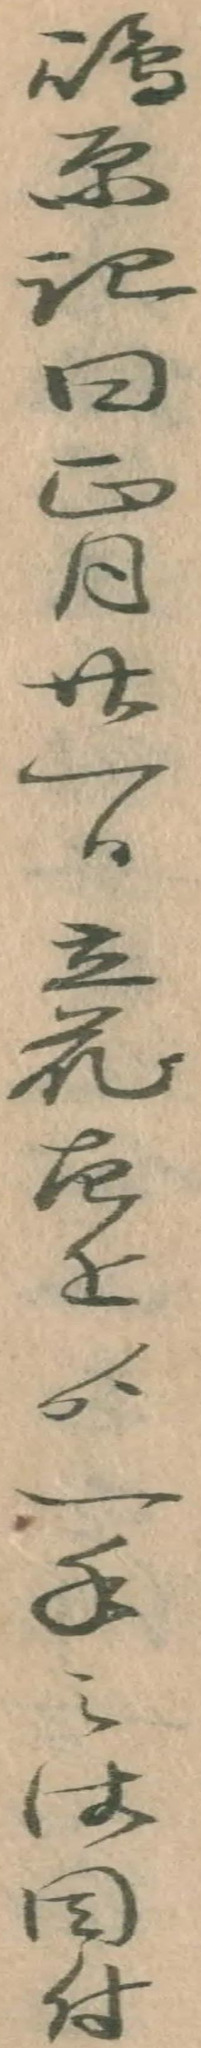島原記曰正月廿一日立花左近ゟ一手之御目付
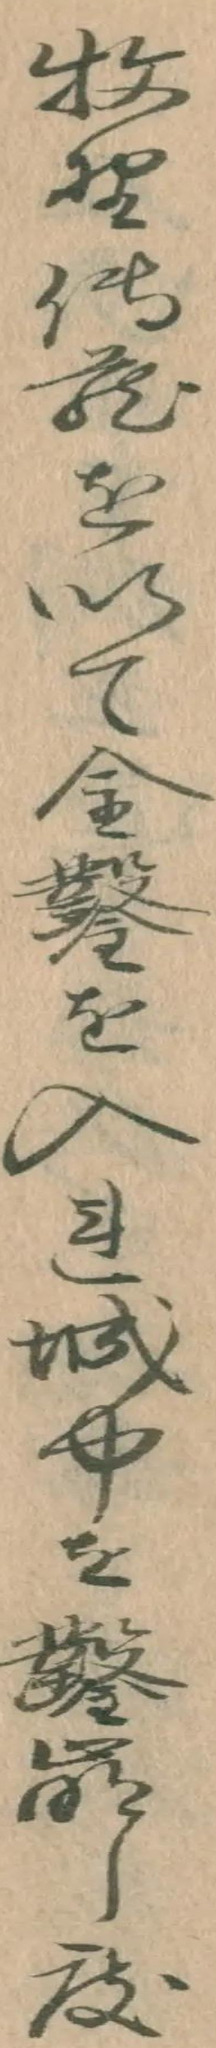牧野伝蔵を以て金鑿を入連城中を鑿崩し度
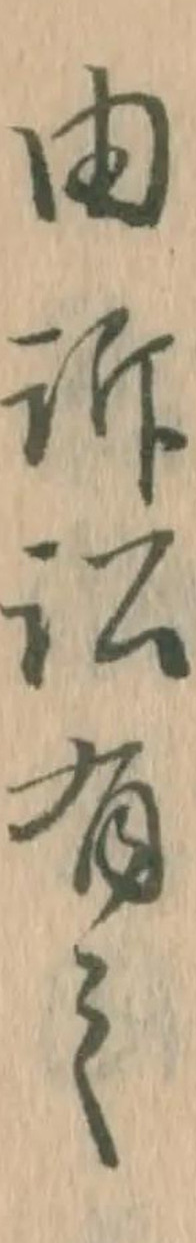由訴訟有之
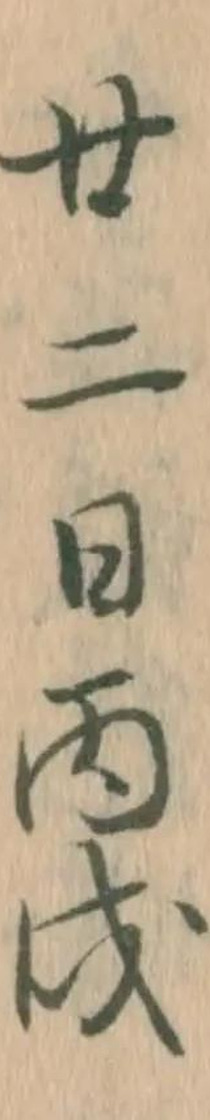廿二日丙戌
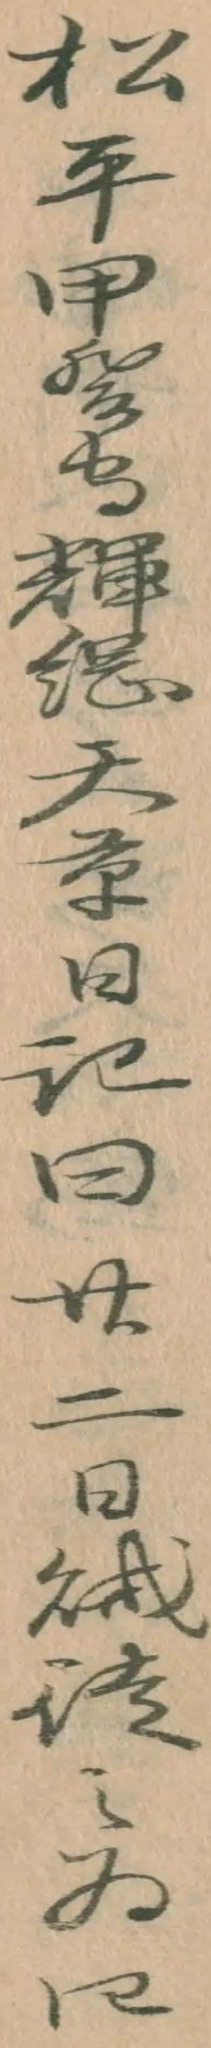松平甲斐守輝綱天草日記曰廿二日賊徒之ゐ四
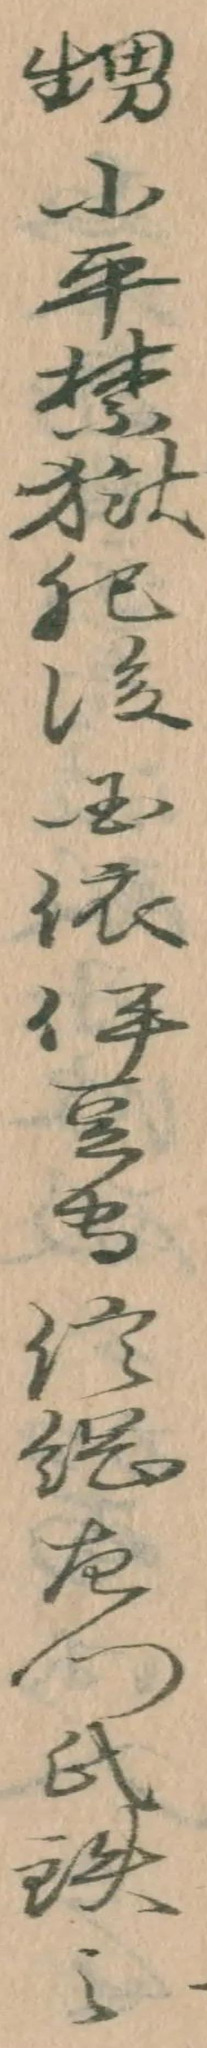甥小平禁獄肥後国依伊豆守信綱左門氏鉄之
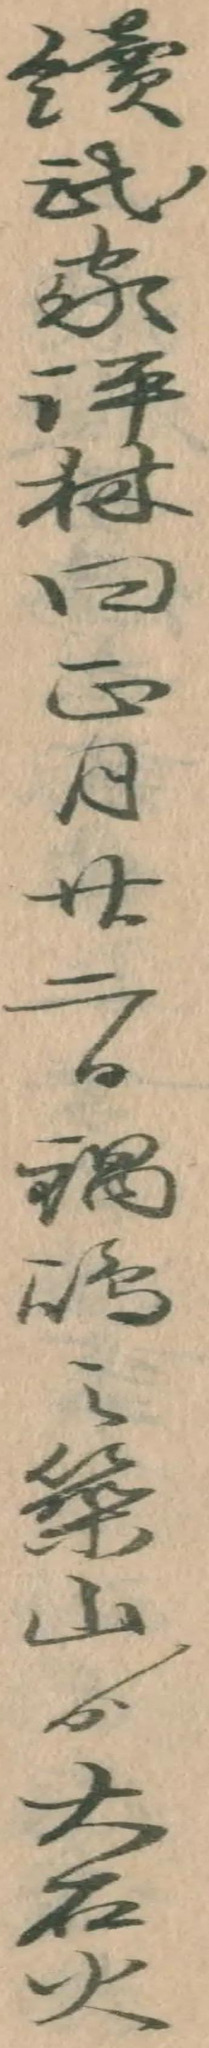続武家評林曰正月廿二日鍋島之築山ゟ大石火
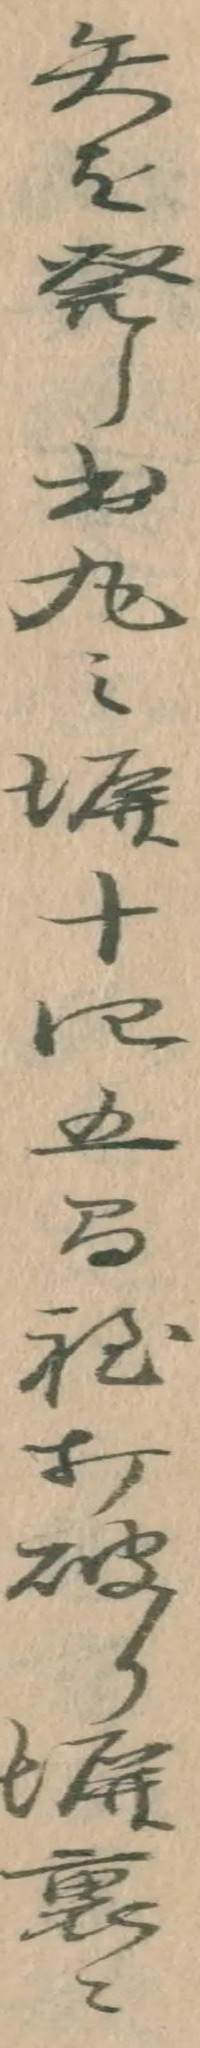矢を発し出丸之塀十四五間程打破り塀裏に
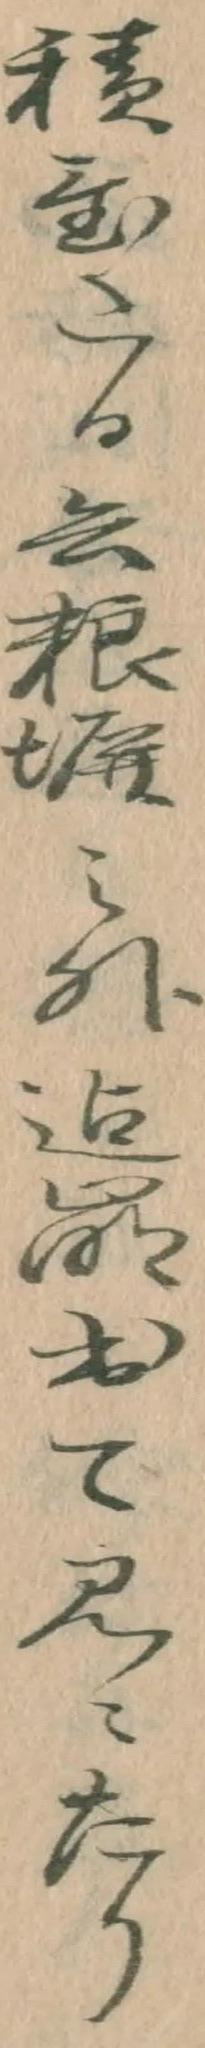積置たる兵粮塀之外迄崩出て見にたり
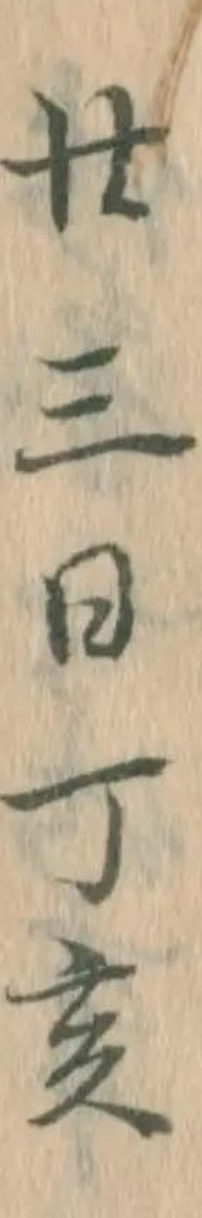廿三日丁亥
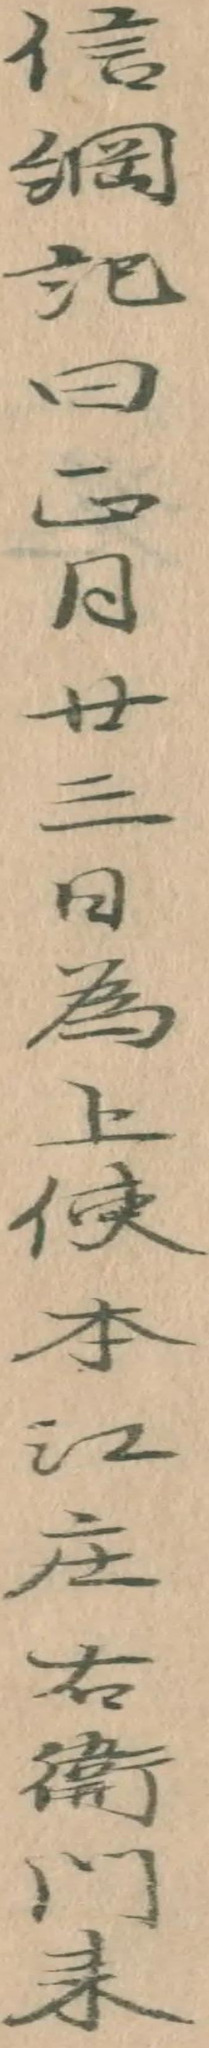信綱記曰正月廿三日為上使本江庄右衛門来
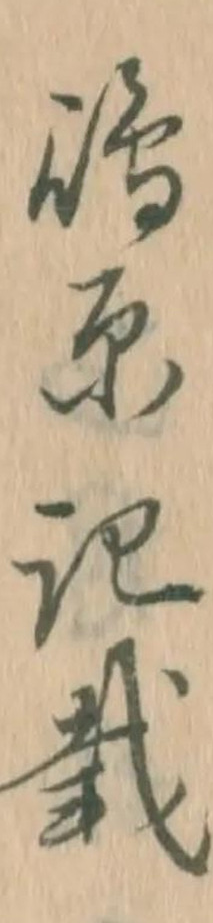島原記載

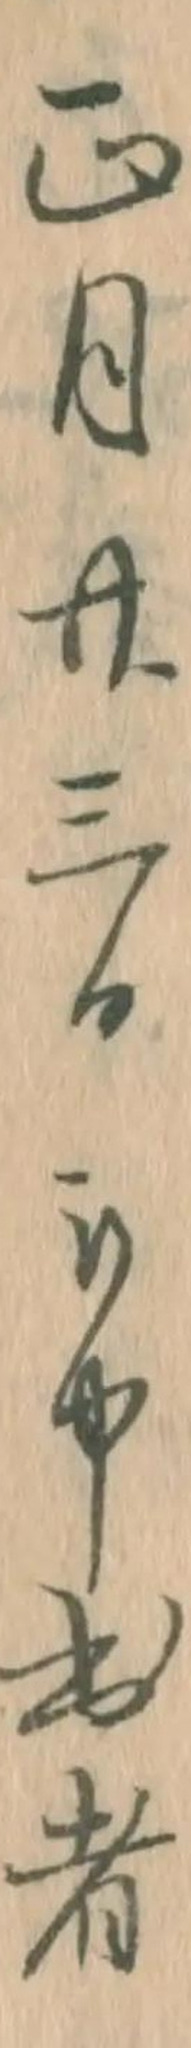正月廿三日被申者
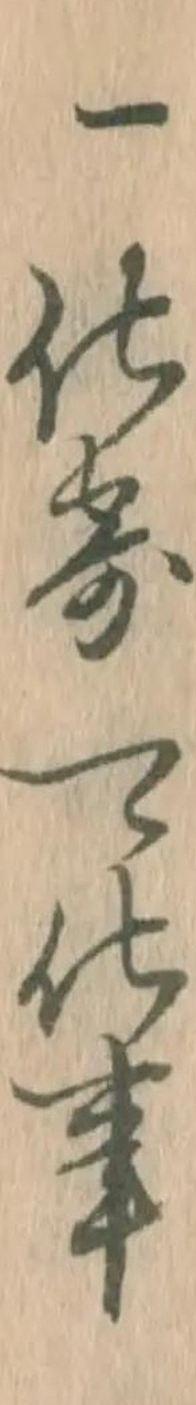一仕寄可仕事
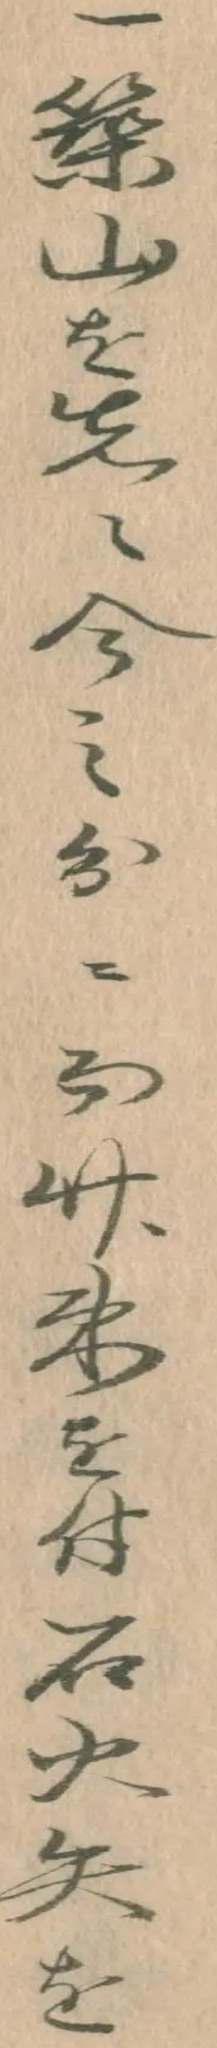一築山を先に今之分に而竹束を付石火矢を
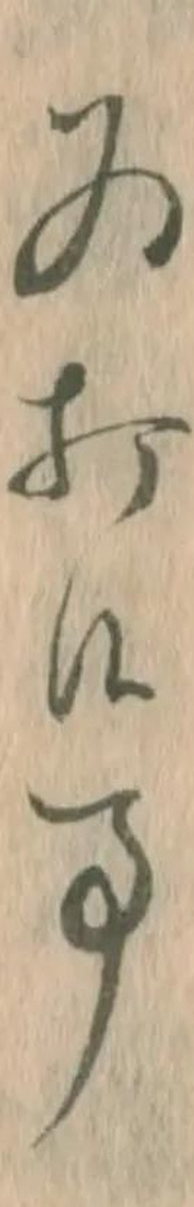ゐ打候事
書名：切支丹御退治記 49巻. [6]
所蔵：国立国会図書館 National Diet Library, JAPAN
